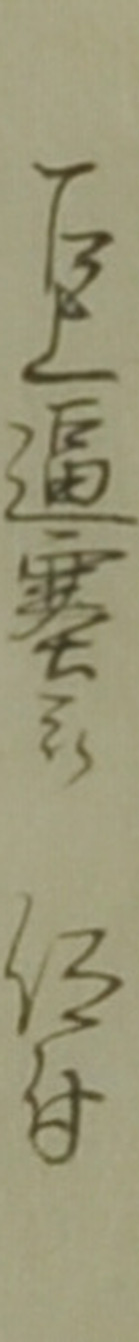召上逼塞被仰付
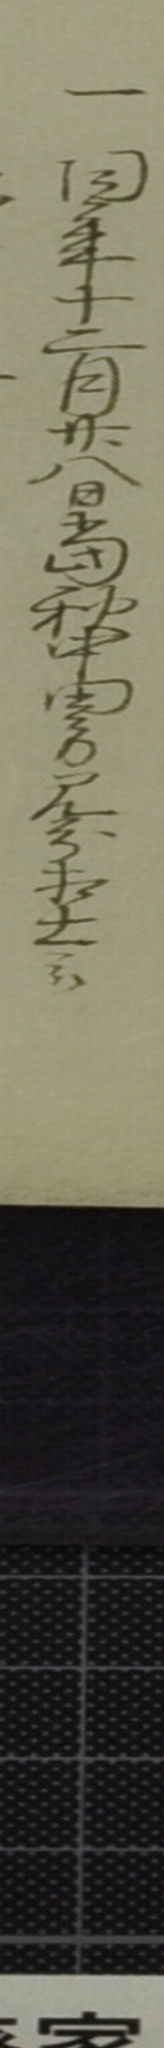一同年十二月廿八日当秋中田方見分相土被
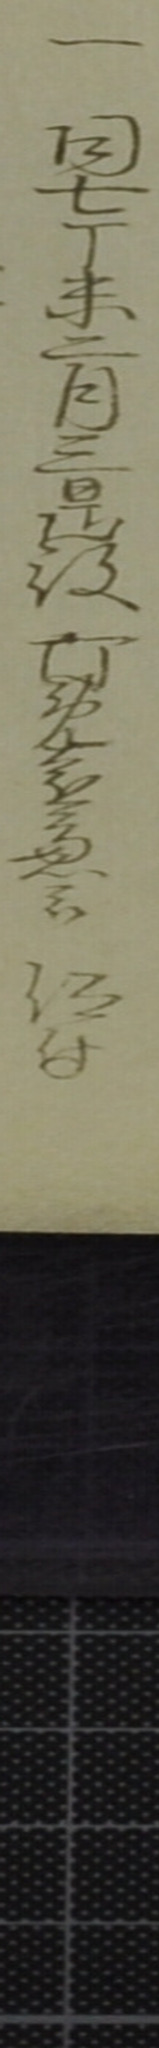一同七丁未二月三日御役御免遠慮被仰付
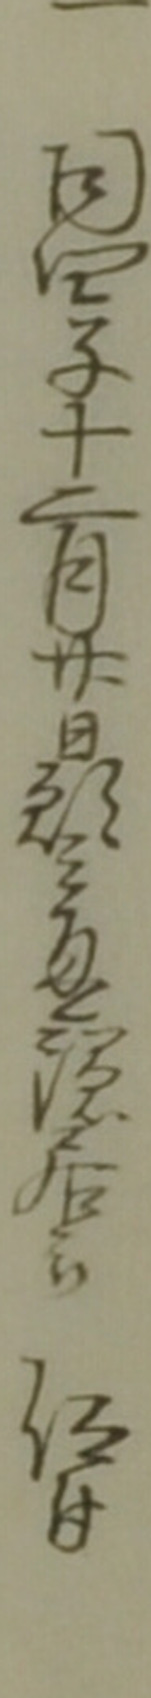一同四子十二月廿日願之通隠居被仰付
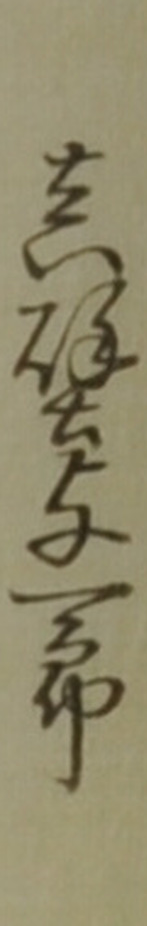真壁与一郎
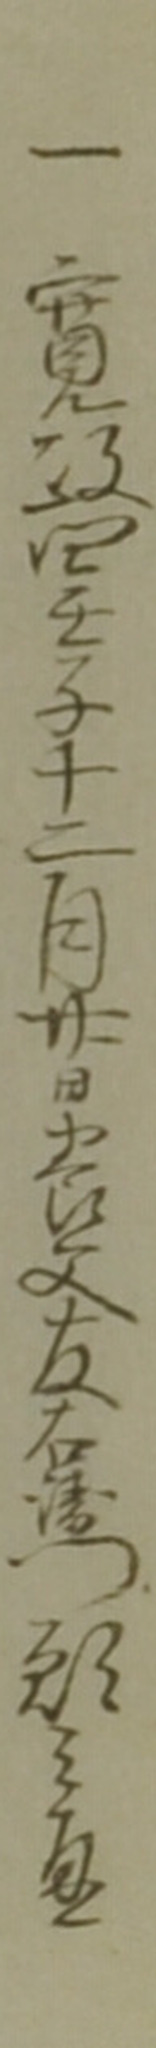一寛政四壬子十二月廿日養子友右衛門願之通
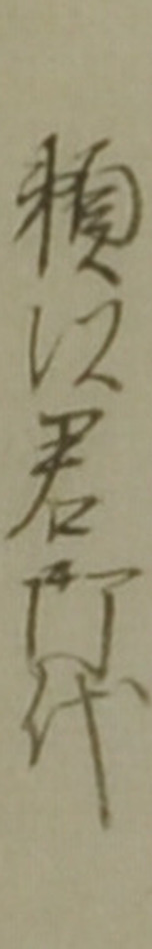頼以君御代
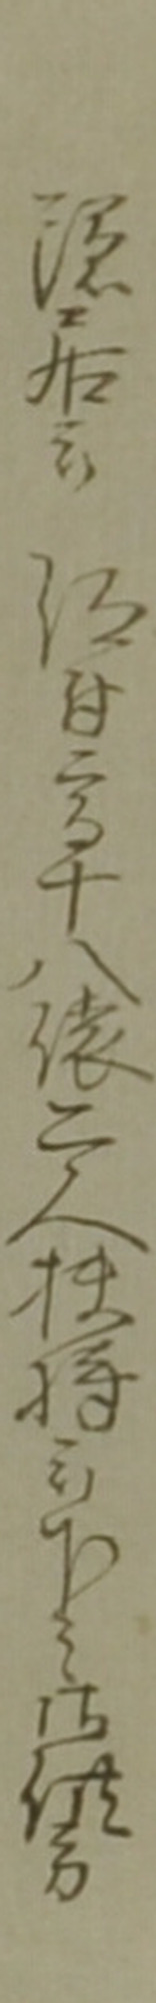隠居被仰付高十八俵二人扶持被下之御供方
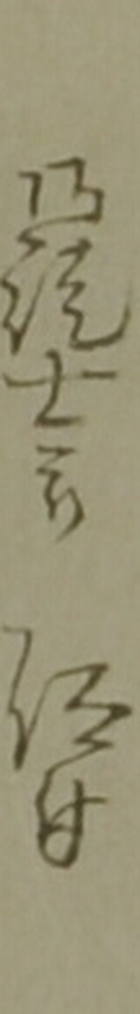御徒士被仰付
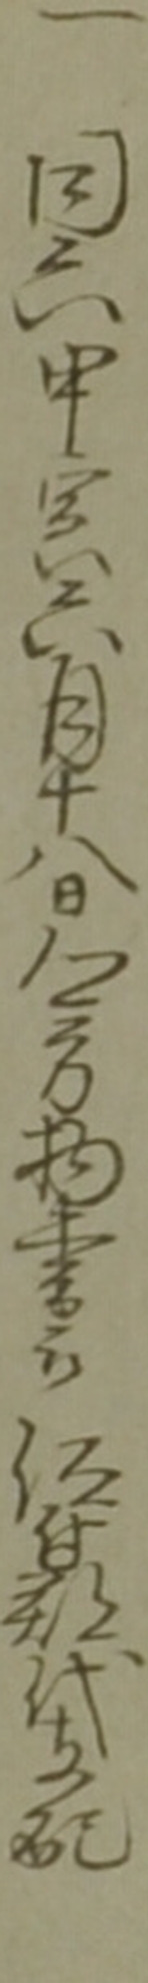一同六甲寅六月十八日郷方物書被仰付郡代支配

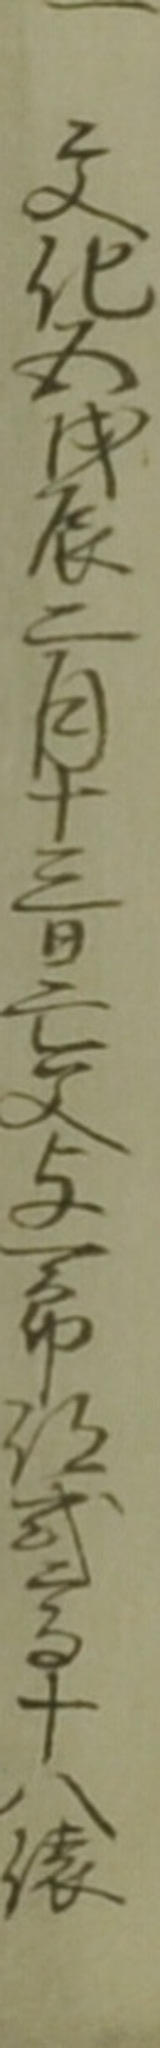一文化五戊辰二月十三日亡父与一郎跡式高十八俵
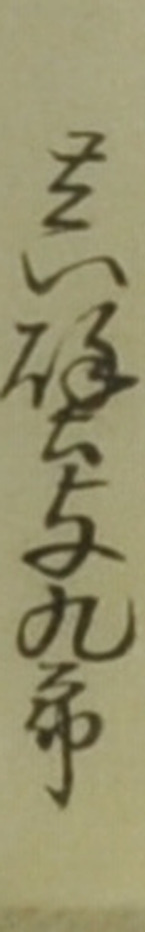真壁与九郎
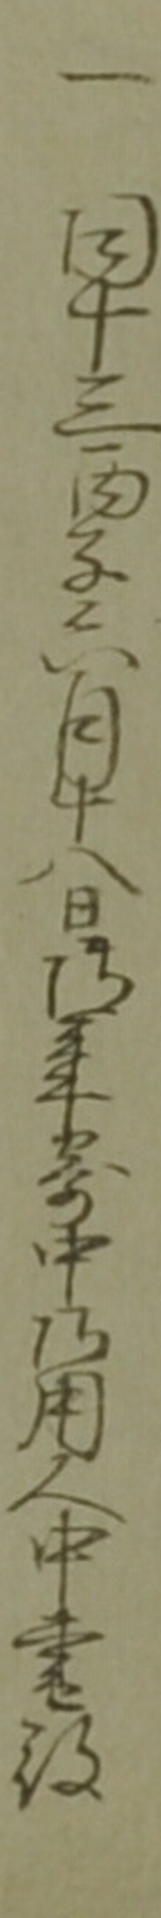一同十三丙子六月十八日御年寄中御用人中書役
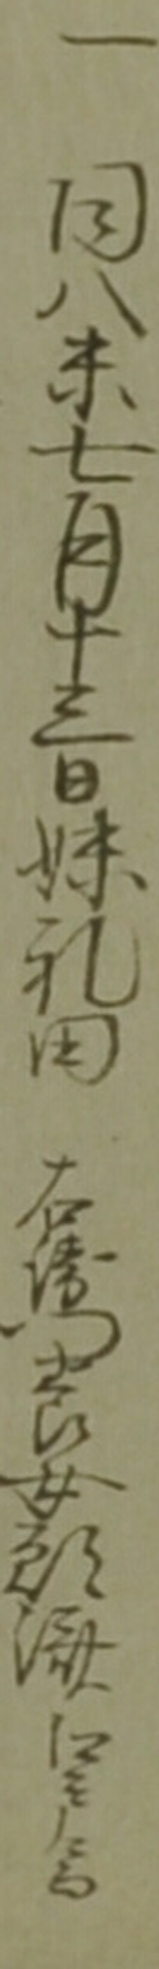一同八未七月十三日妹礼田右衛門養女願済江戸ニ而
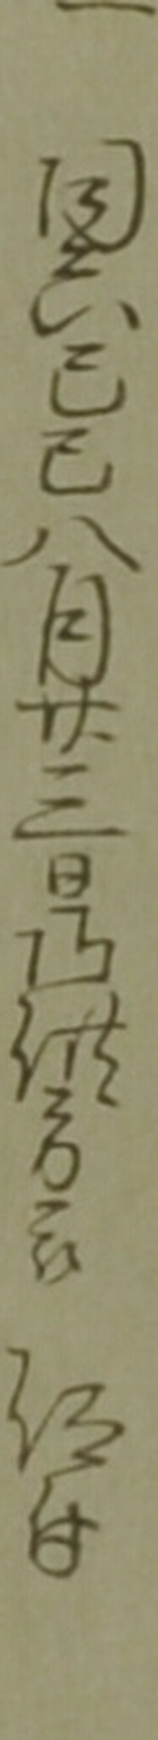一同六己巳八月廿三日御供方被仰付
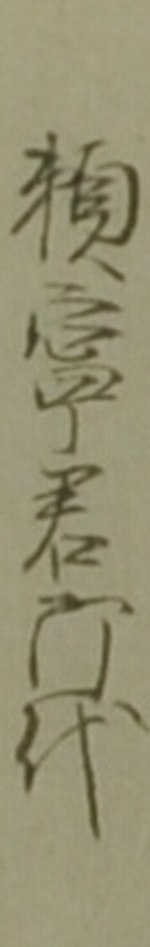頼寧君御代
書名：無足廃家（弐）
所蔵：伊那市立高遠町図書館・合同会社AMANE
